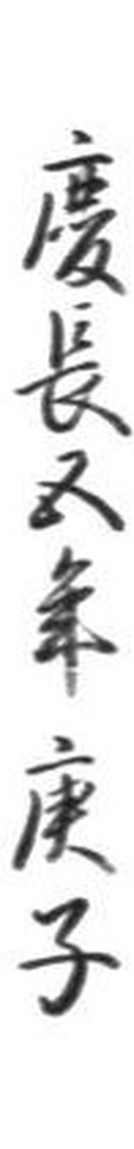慶長五年庚子
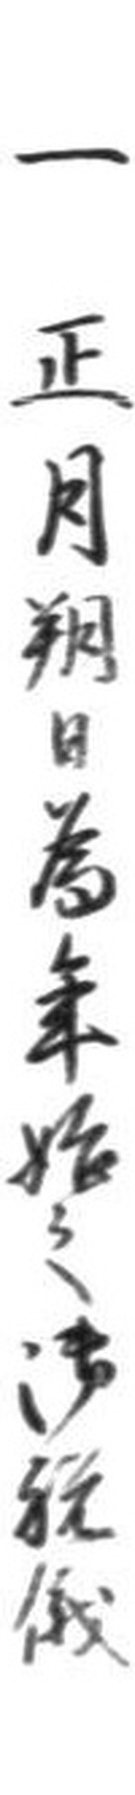一正月朔日為年始之御祝儀
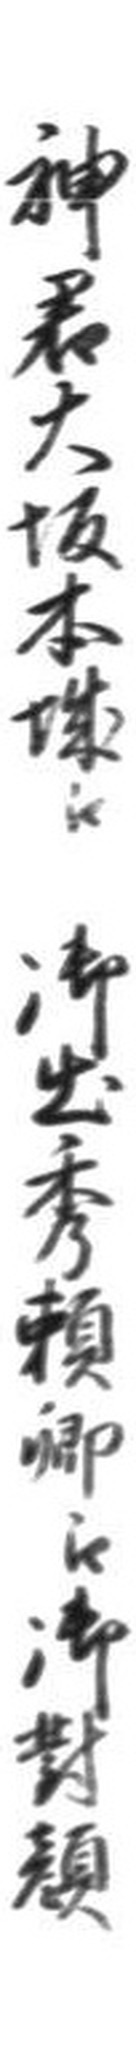神君大坂本城江御出秀頼卿江御対顔
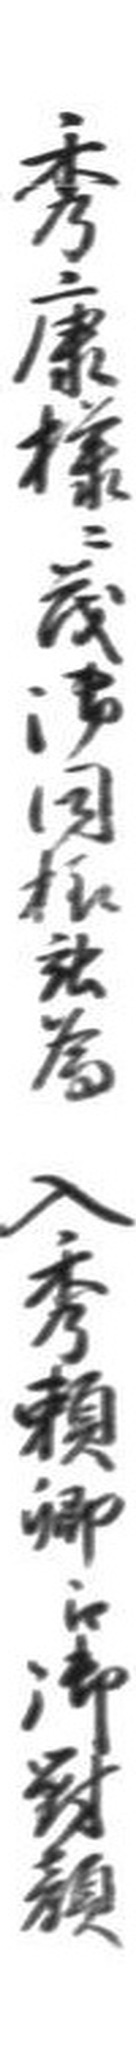秀康様ニも御同様被為入秀頼卿江御対顔
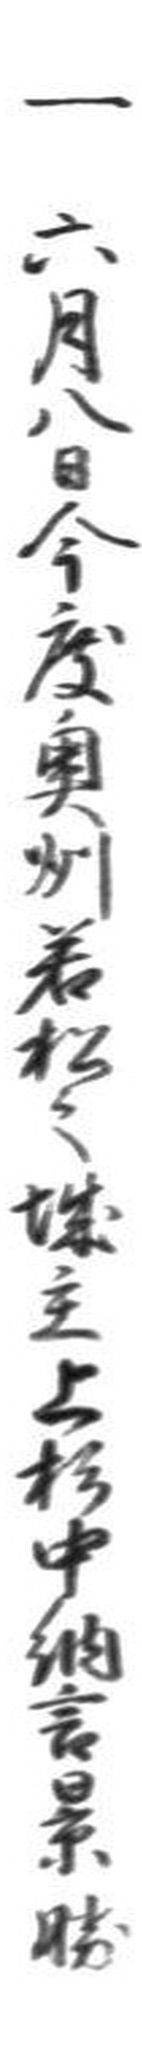六月八日今度奥州若松之城主上杉中納言景勝
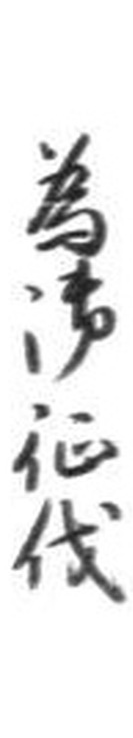為御征伐
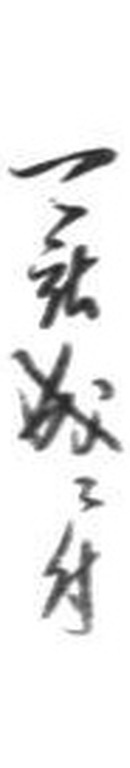可被成ニ付
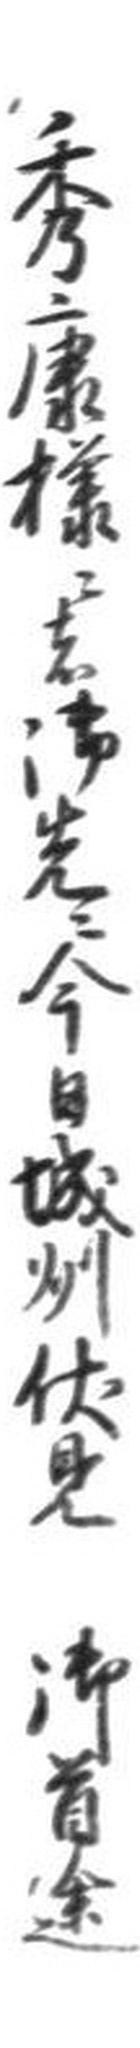秀康様ニ者御先ニ今日城州伏見御首途

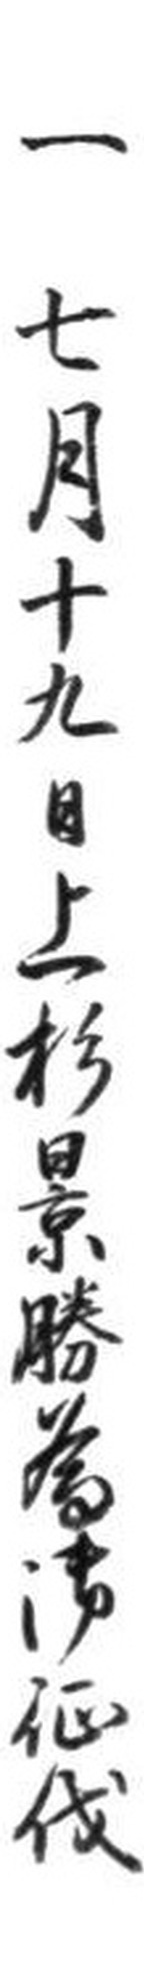一七月十九日上杉景勝為御征伐
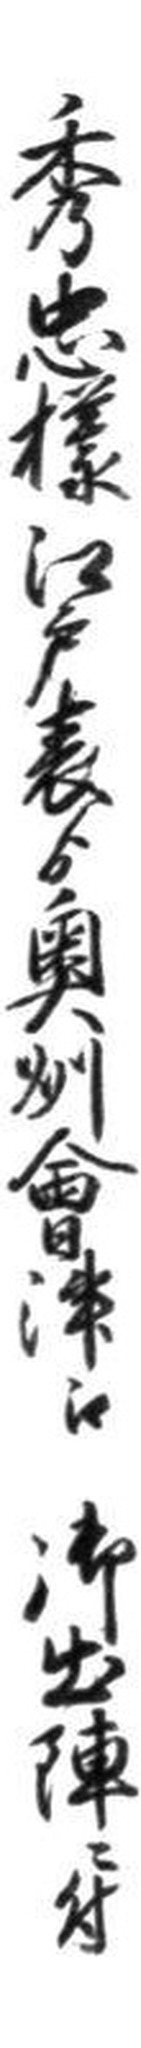秀忠様江戸表ゟ奥州会津江御出陣ニ付
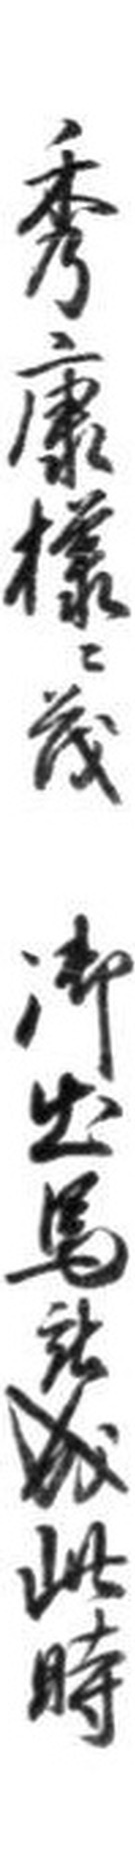秀康様ニも御出馬被成此時
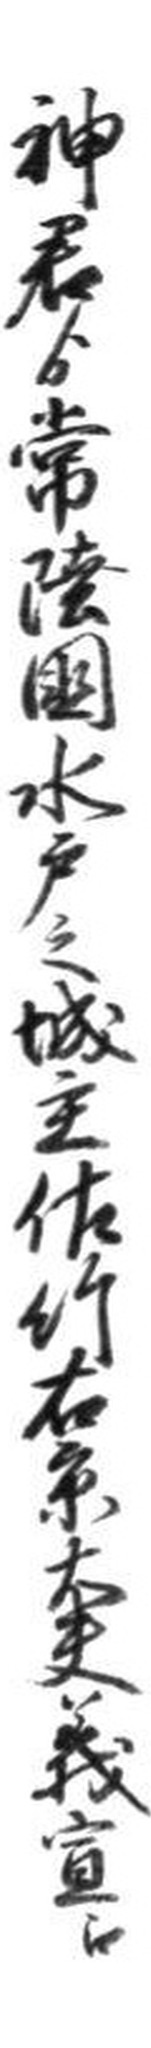神君ゟ常陸国水戸之城主佐竹右京大夫義宣江
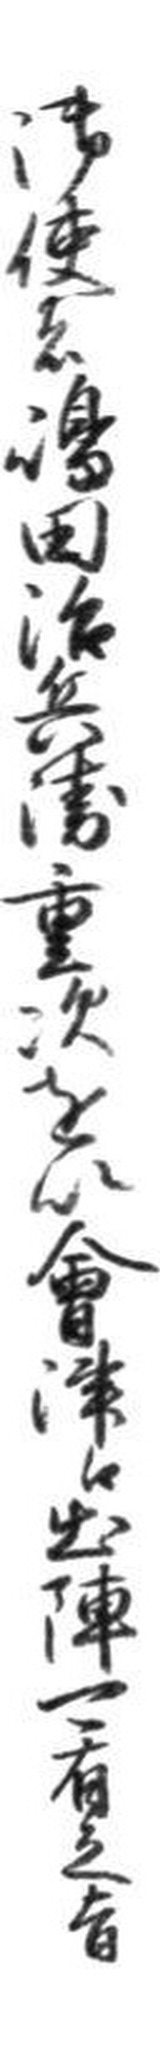御使者嶋田治兵衛重次を以会津江出陣可有之旨
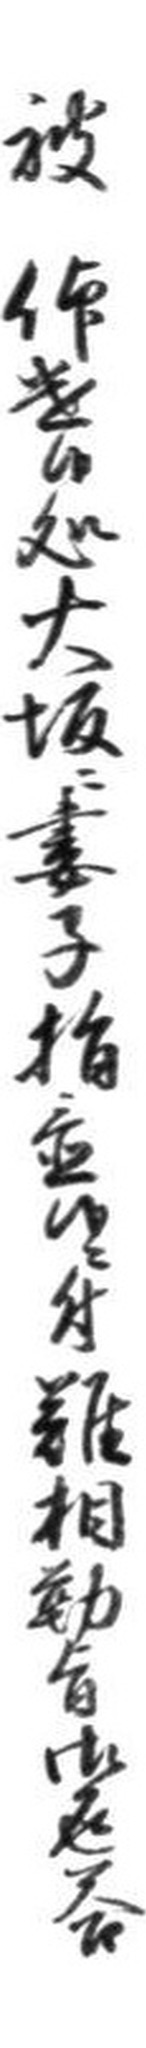被仰遣候処大坂ニ妻子指置候ニ付難相勤旨御返答
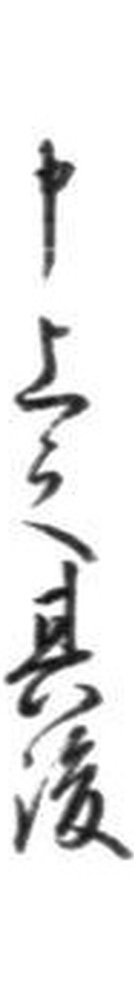申上之其後
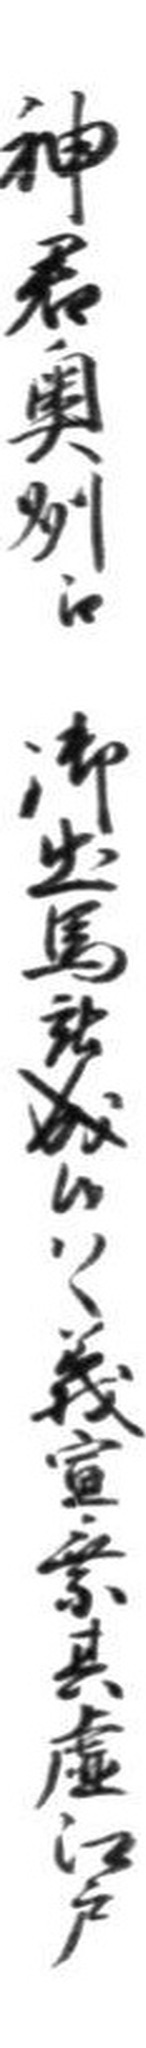神君奥州江御出馬被成候ハヽ義宣乗其虚江戸
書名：家譜 一 秀康公 従天正二年到慶長十二年
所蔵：福井県文書館 Fukui Prefectural Archives
